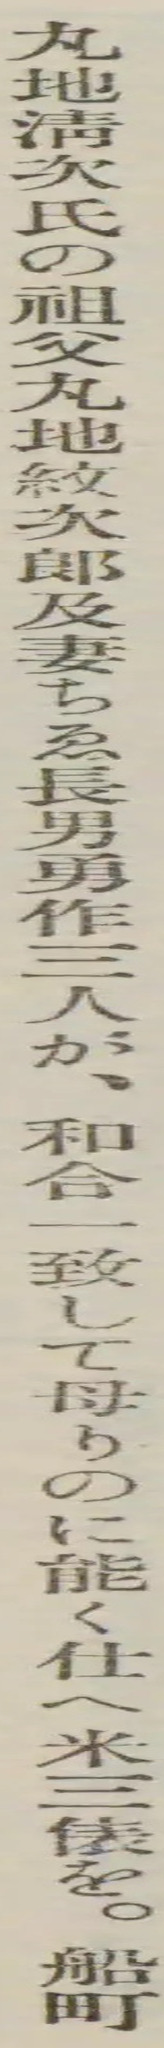丸地清次氏の祖父丸地紋次郎及妻ちゑ長男勇作三人が、和合一致して母りのに能く仕へ米三俵を。船町
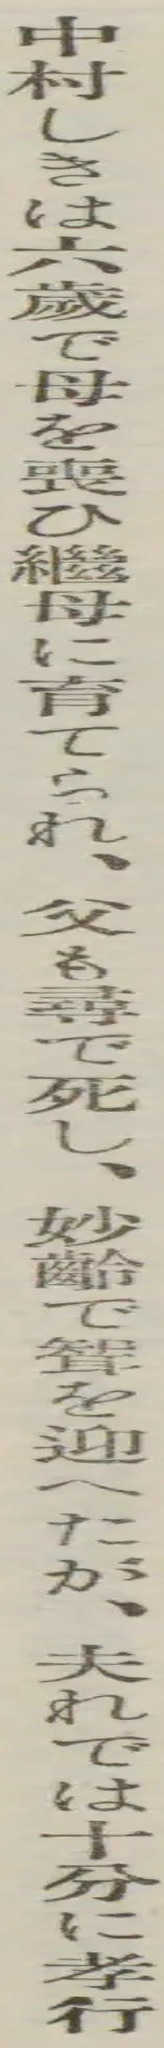中村しきは六歳で母を喪ひ継母に育てられ、父も尋で死し、妙齢で聟を迎へたが、夫れでは十分に孝行
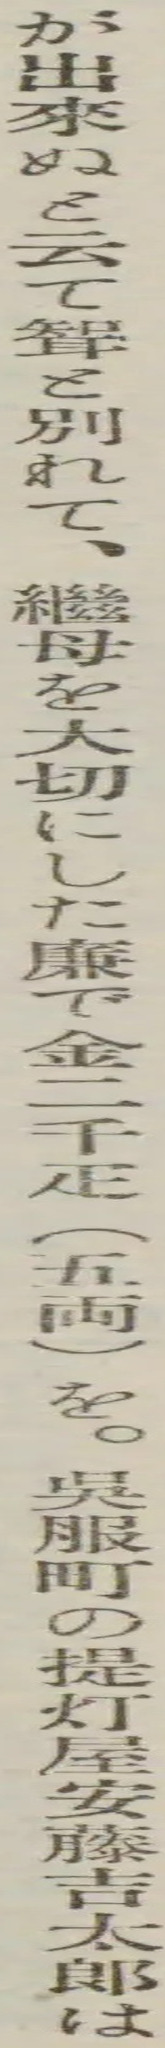が出来ぬと云て聟と別れて、継母を大切にした廉で金二千疋(五両)を。呉服町の提灯屋安藤吉太郎は
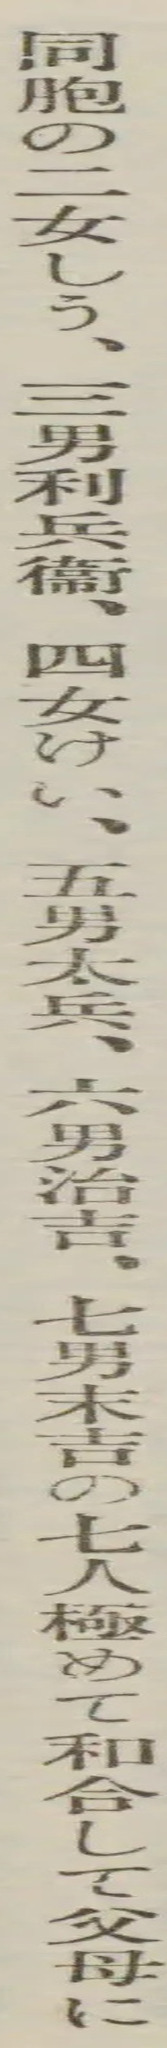同胞の二女しう、三男利兵衛、四女けい、五男太兵、六男治吉、七男末吉の七人極めて和合して父母に
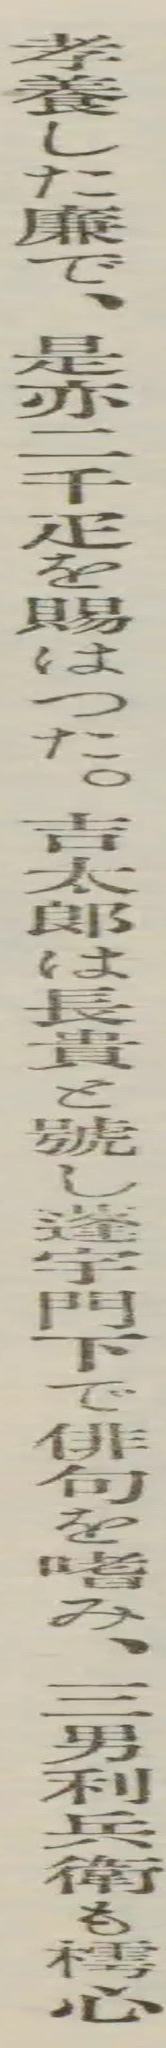孝養した廉で、是亦二千疋を賜はつた。吉太郎は長貴と号し蓬宇門下で俳句を嗜み、三男利兵衛も樗心
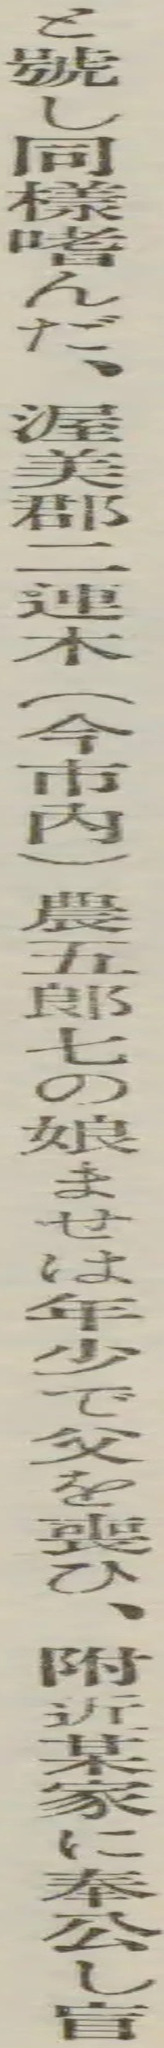と号し同様嗜んだ、渥美郡二連木(今市内)農五郎七の娘ませは年少で父を喪ひ、附近某家に奉公し盲
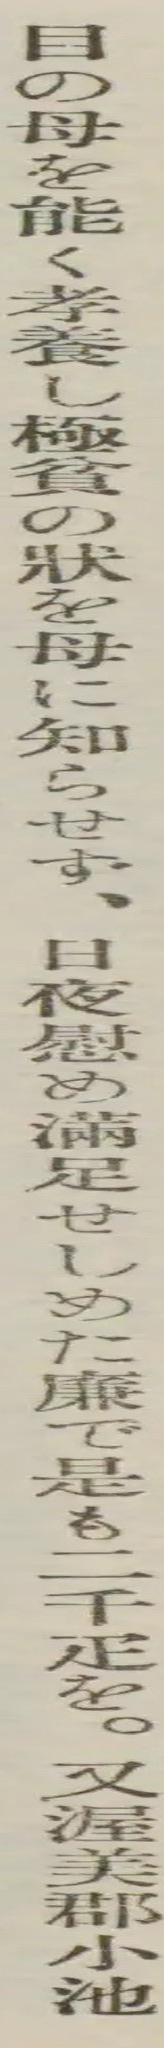目の母を能く孝養し極貧の状を母に知らせず、日夜慰め満足せしめた廉で是も二千疋を。又渥美郡小池
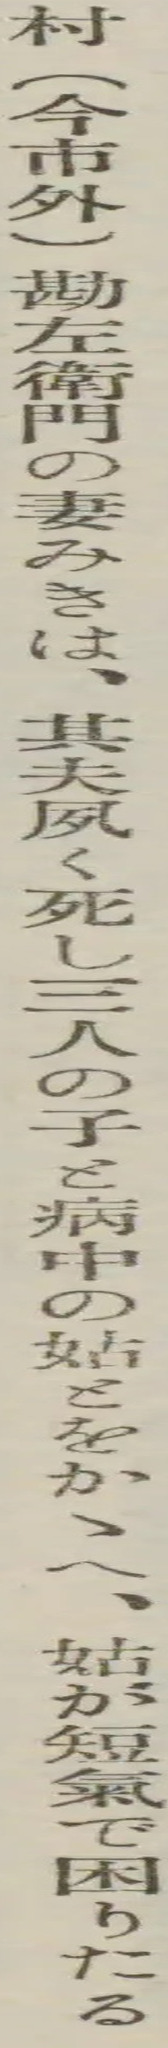村(今市外)勘左衛門の妻みきは、其夫夙く死し三人の子と病中の姑とをかゝへ、姑が短気で困りたる
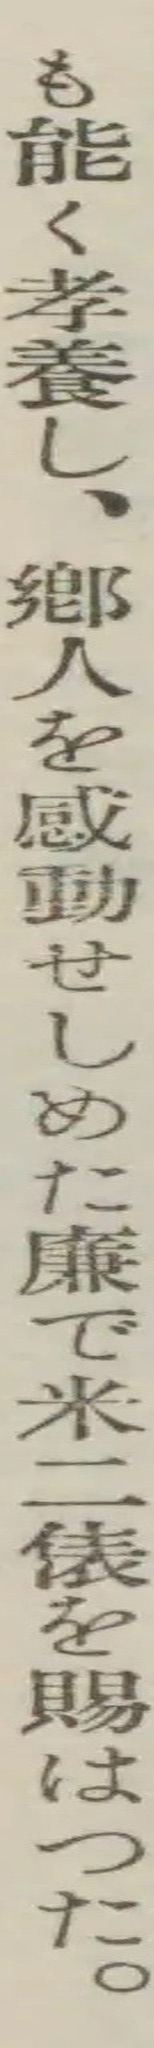も能く孝養し、郷人を感動せしめた廉で米二俵を賜はつた。
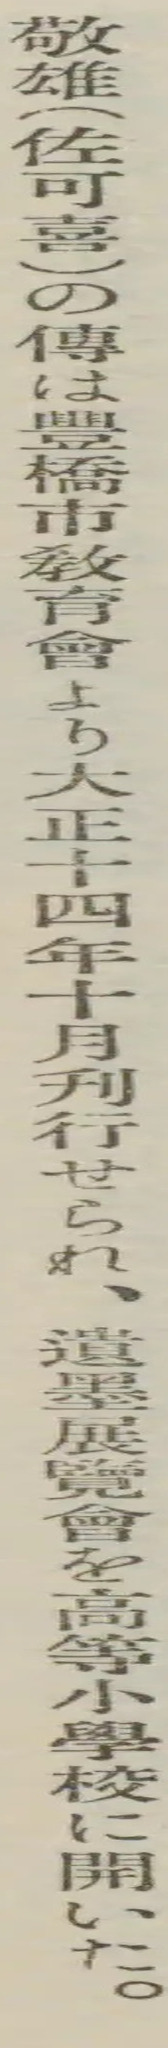敬雄(佐可喜)の伝は豊橋市教育会より大正十四年十月刊行せられ、遺墨展覧会を高等小学校に開いた。
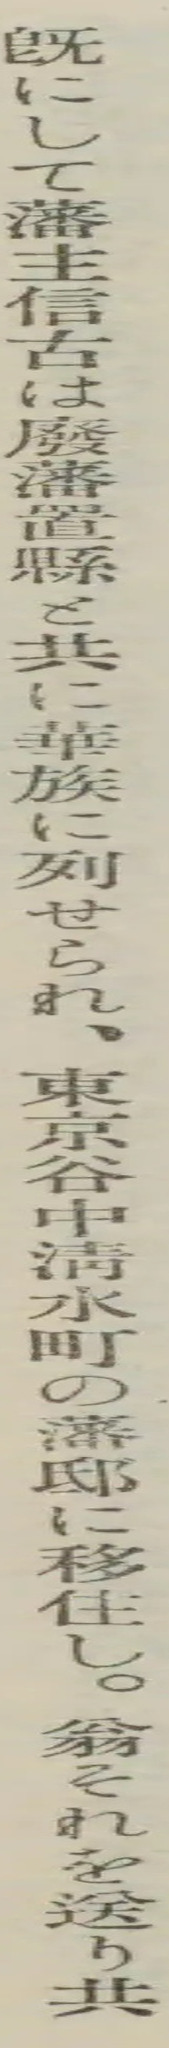既にして藩主信古は廃藩置県と共に華族に列せられ、東京谷中清水町の藩邸に移住し。翁それを送り共
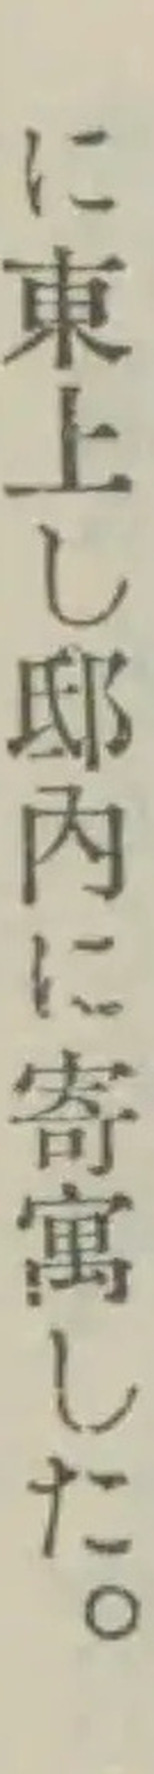に東上し邸内に寄寓した。
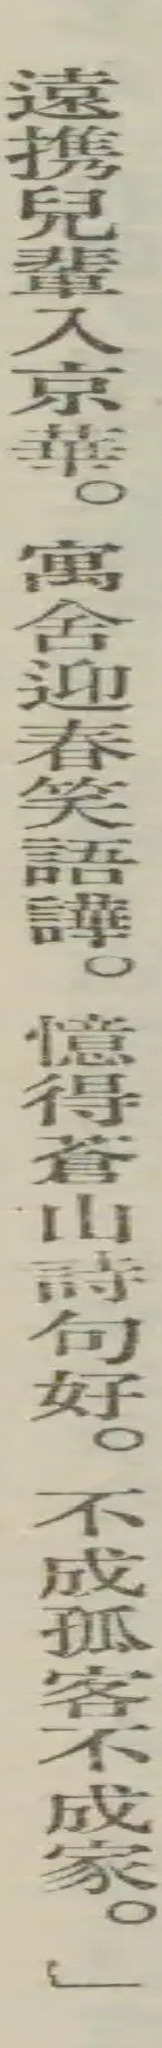遠携兒輩入京華。寓舎迎春笑語譁。憶得蒼山詩句好。不成孤客不成家。」
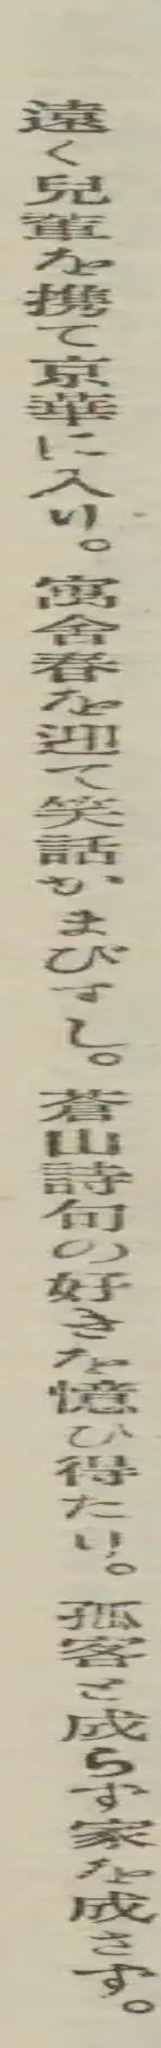遠く兒輩を携て京華に入り。寓舎春を迎て笑話かまびすし。蒼山詩句の好きを憶ひ得たり。孤客と成らず家を成さず。
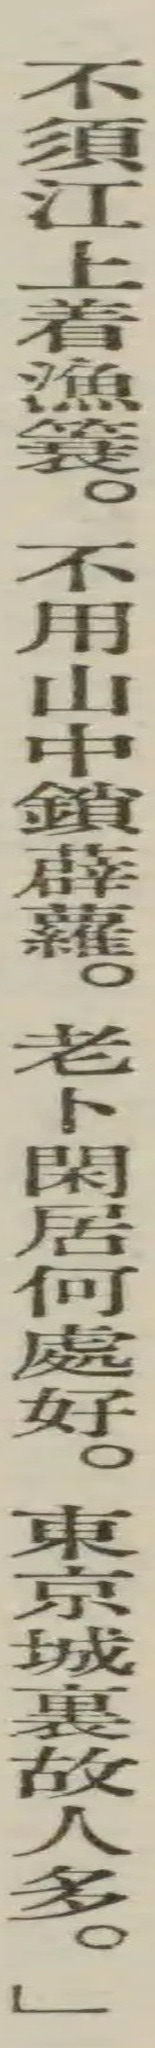不須江上着漁簑。不用山中鎖薜蘿。老卜閑居何處好。東京城裏故人多。」
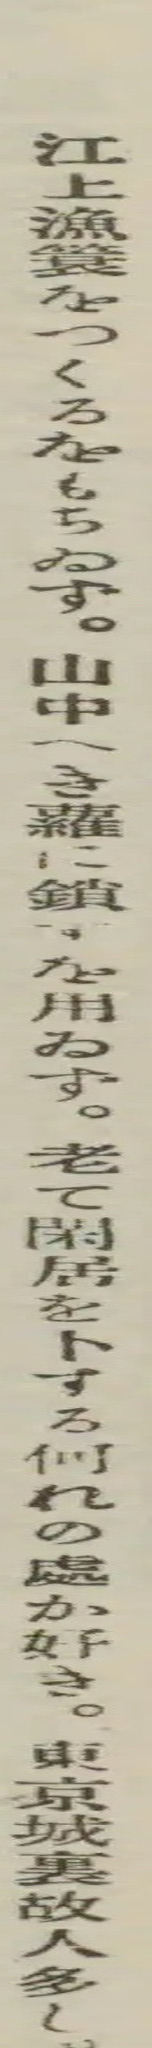江上漁簑をつくるをもちゐず。山中へき蘿に鎖すを用ゐず。老て閑居を卜する何れの処か好き。東京城裏故人多し。
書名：小野湖山翁小伝
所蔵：国立国会図書館 National Diet Library, JAPAN
